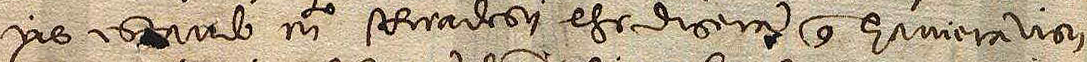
ys estando mto ffora de sy lhe diserā q̄ ha uiera visy
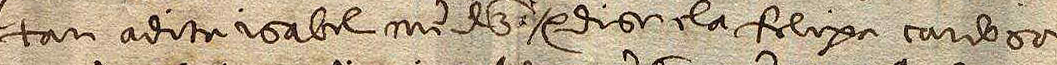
tar a dita isabel mēdez / e dise ela felipa cardosa
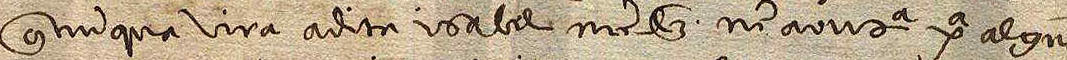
q̄ nūqua vira a dita isabel mēdez. nē a outa pa algū
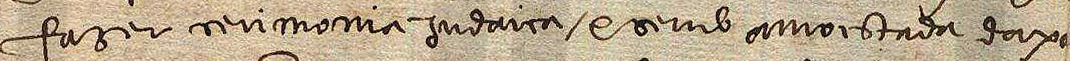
fazer cerimonia Judaica / e sendo amoestada da p
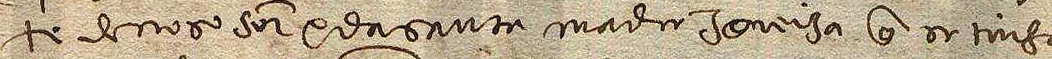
te noso Sōr e da santa madre Jgreija q̄ se tinha
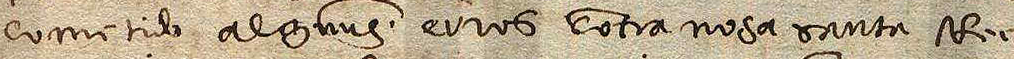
cometido alguūs erros c̄otra nosa santa ffee
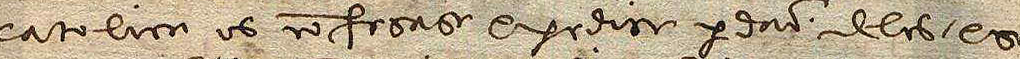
catolica os c̄ofesase e pedise ꝑdaõ. deles / e se
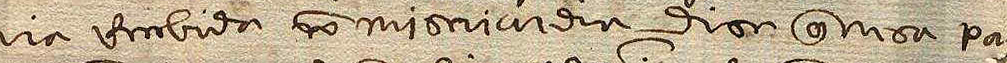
ria Revebida c̄o misericordia dise q̄ nesa pa
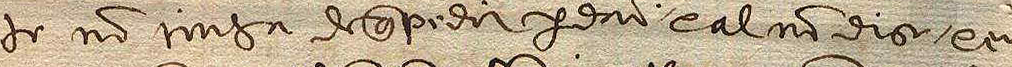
te nō tinha de q̄ pedir ꝑdaõ ./ e al nō dise / e eu
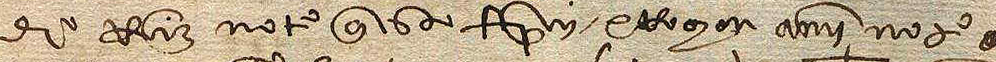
dio Rōiz noto q̄ esto stp̄vy / e Rogou a m̄j noto q̄
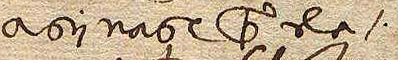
asynase p̄o ela /.
